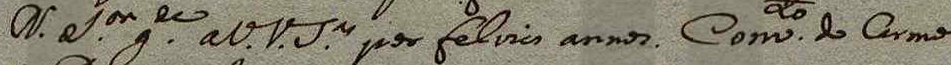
N. S.or g.de a V. V. S.as por felizis annos. Conv.to do Carmo
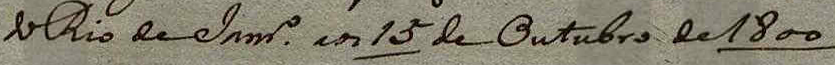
do Rio de Ianr.o aos 15 de Outubro de 1800
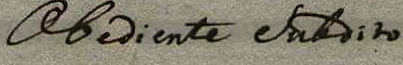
Obediente subdito
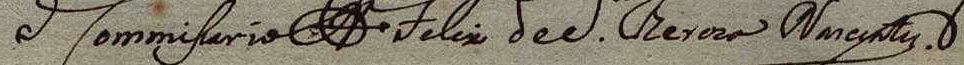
O Commissario Fr Felix de S.ta Tereza Nascentes.
